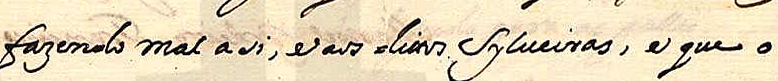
fazendo mal a si, e aos dittos Sylueiras, e que o
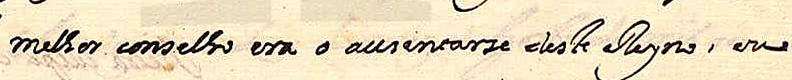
melhor conselho era o ausentarse deste Reyno, ou
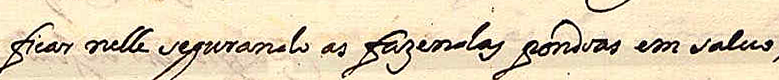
ficar nelle segurando as fazendas pondoas em saluo,
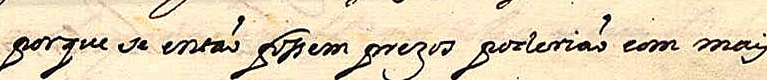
porque se entaõ fossem prezos poderiaõ com mais
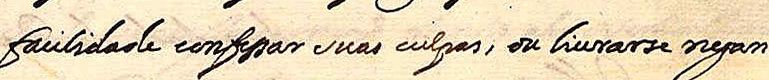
facilidade confessar suas culpas, ou liurarse negan
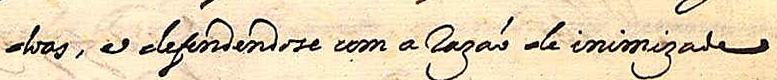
doas, e defendendose com a Razaõ de inimizade
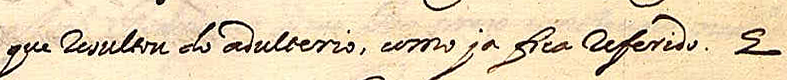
que Resultou do adulterio, como ja fica Referido. E
